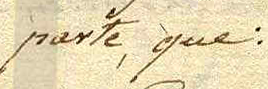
parte, que:
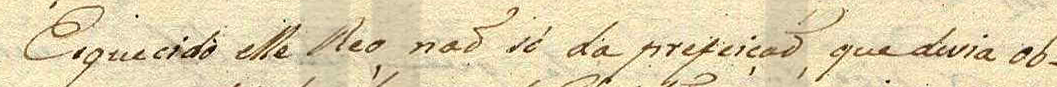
Esquecido elle Reo, naõ só da prefeiçaõ, que devia ob
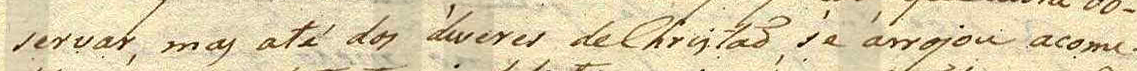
servar, mas até dos deveres de Christaõ, se arrojou a come
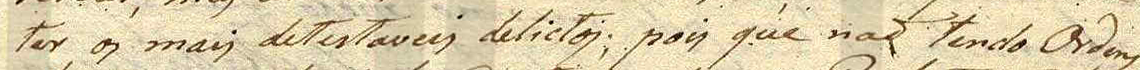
ter os mais detestaveis delictos; pois que naõ tendo Ordens
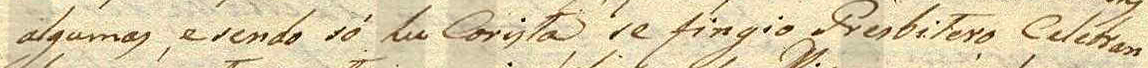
algumas, e sendo só hu Corista, se fingio Presbitero Celebran
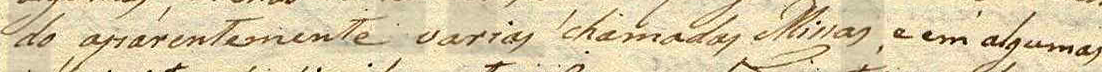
do aparentemente varias chamadas Missas, e em algumas
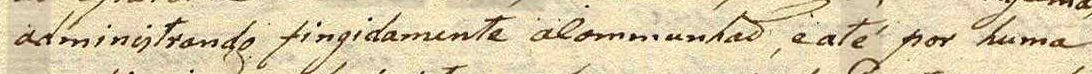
administrando fingidamente a Communhão, e até por huma
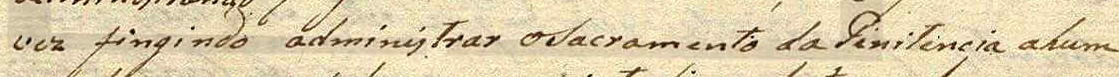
vez fingindo administrar o Sacramento da Penitencia a hum
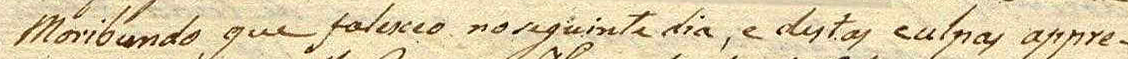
Moribundo, que falesceo no seguinte dia, e destas culpas appre
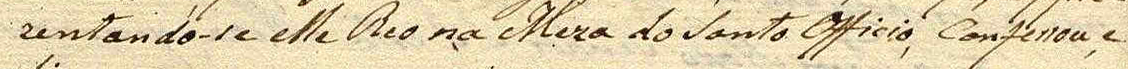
zentando-se elle Reo na Meza do Santo Officio, Confessou, e
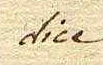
dice
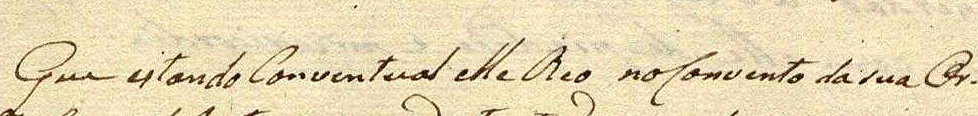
Que estando Conventual elle Reo no Convento da sua Or
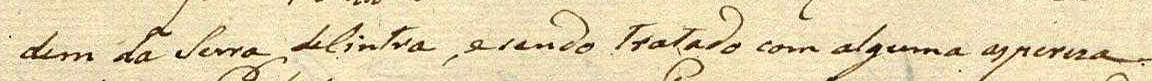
dem da Serra de Cintra, e sendo tratado com alguma aspereza
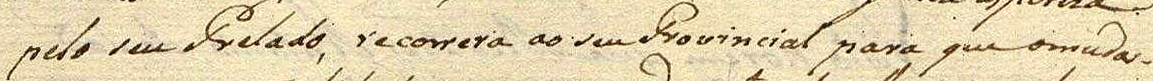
pelo seu Prelado, recorrera ao seu Provincial para que o muda
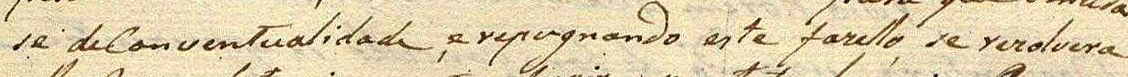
se de Conventualidade, e repugnando este fazello se rezolvera
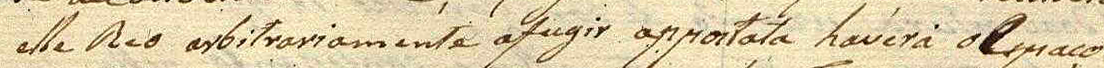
elle Reo arbitrariamente a fugir appostata haverá o Espaço
